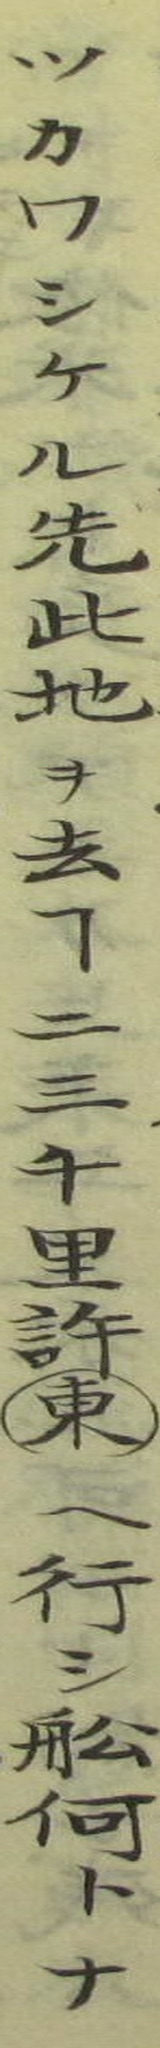ツカワシケル先此地ヲ去可二三千里許東ヘ行シ舩何トナ
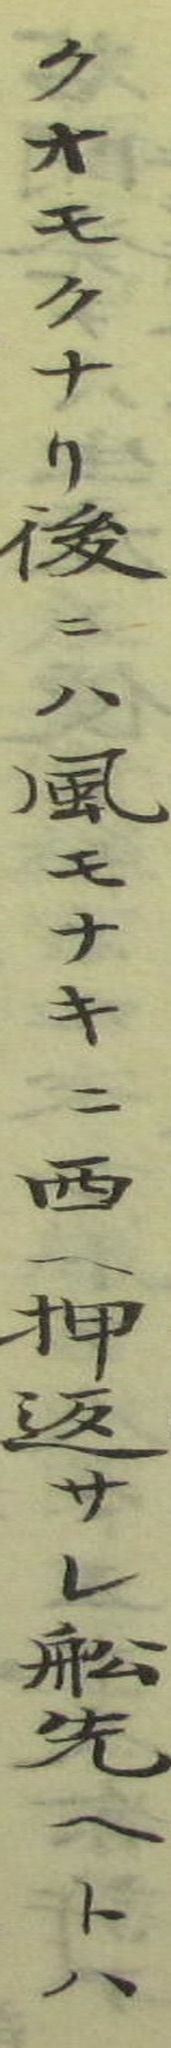クオモクナリ後ニハ風モナキニ西ヘ押返サレ舩先ヘトハ
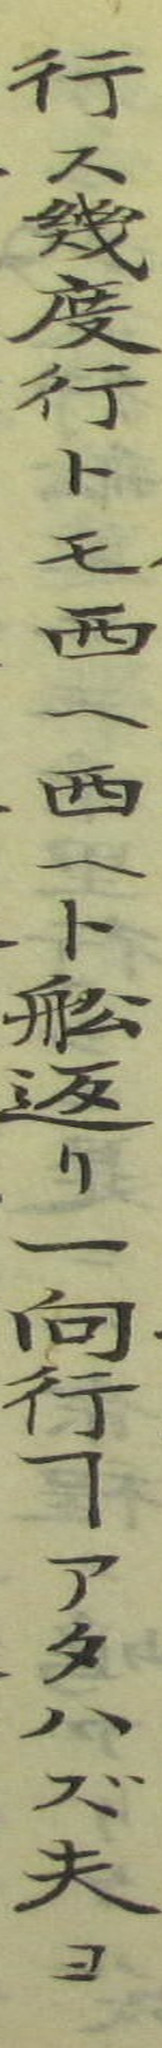行ス幾度行トモ西ヘ西ヘト舩返リ一向行可アタハズ夫ヨ
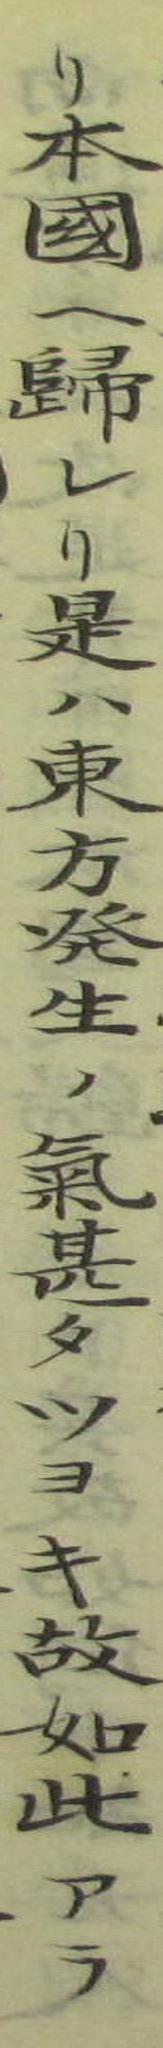リ本國ヘ帰レリ是ハ東方発生ノ氣甚タツヨキ故如此アラ
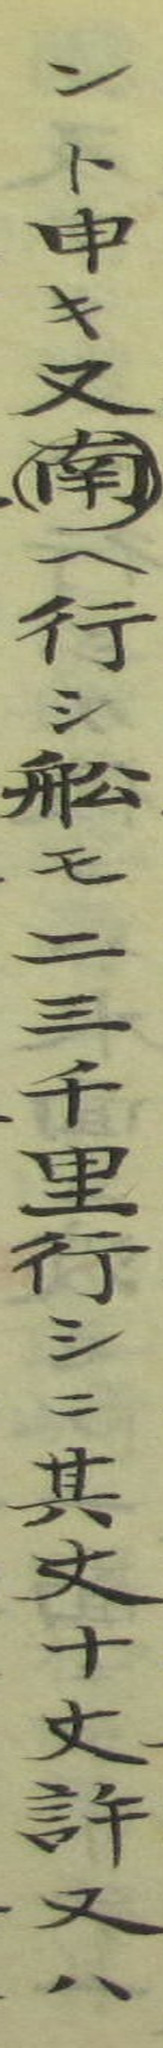ント申キ又南へ行シ舩モ二三千里行シニ其文十文許又ハ
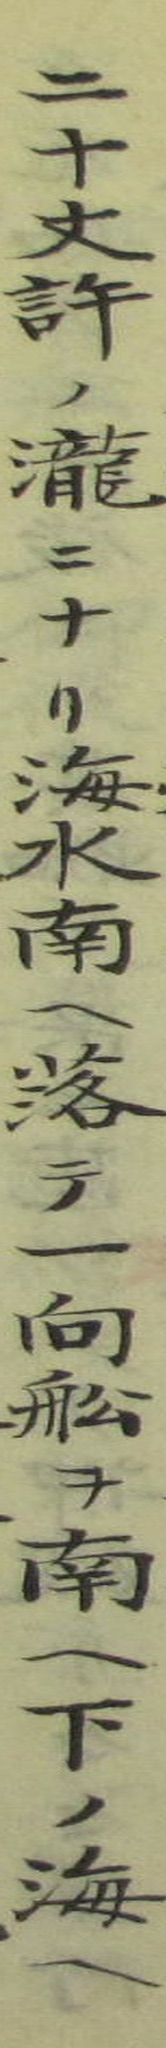二十文許ノ瀧ニナリ海水南へ落テ一向舩ヲ南へ下ノ海へ
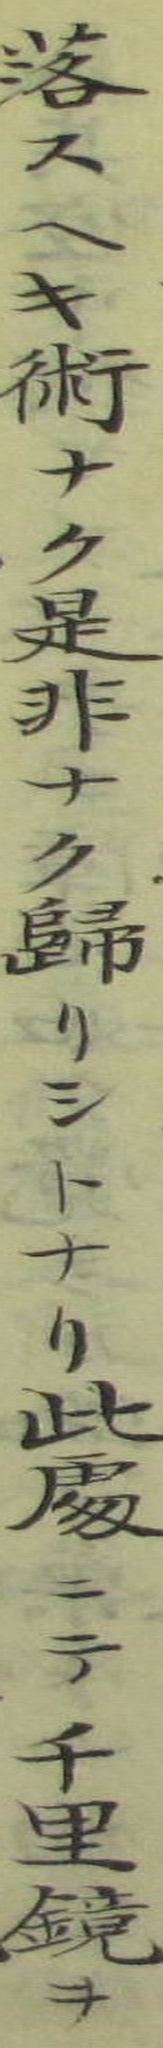落スヘキ術ナク是非ナク帰リシトナリ此處ニテ千里鏡ヲ
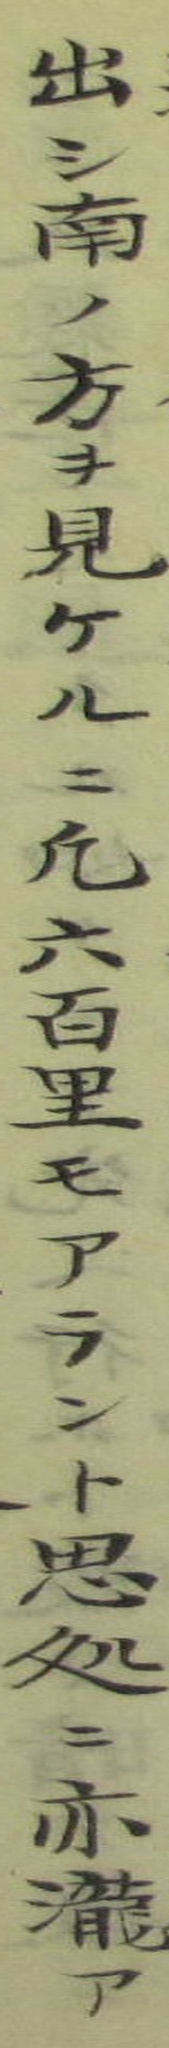出シ南ノ方ヲ見ケルニ凡六百里モアラント思処ニ亦瀧ア
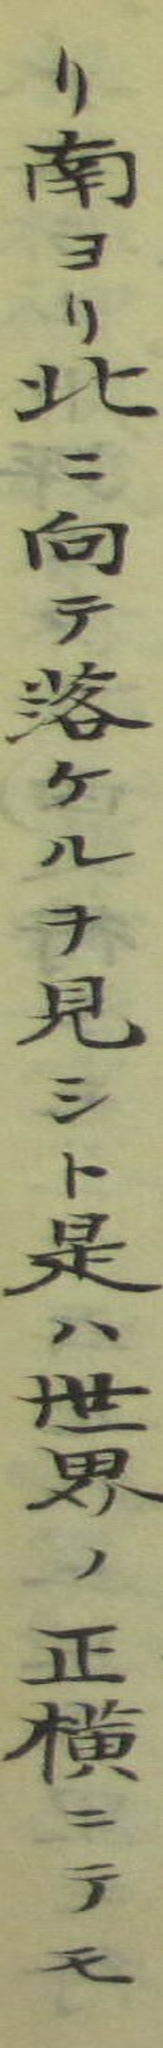リ南ヨリ北ニ向テ落ケルヲ見シト是ハ世界ノ正横ニテモ

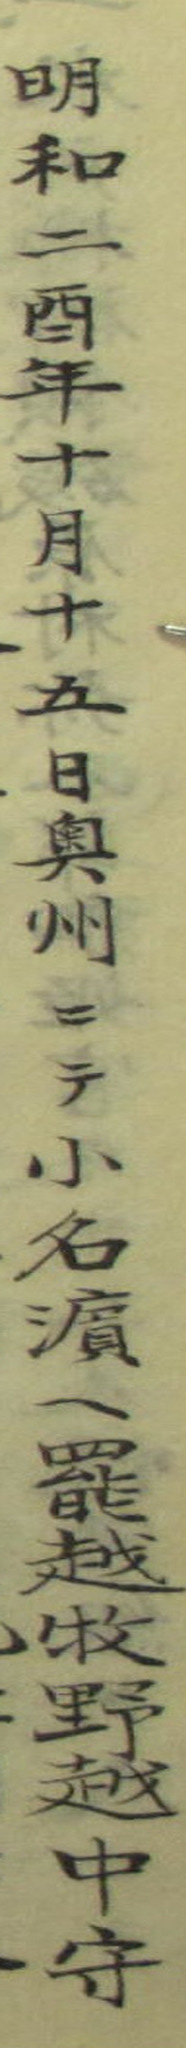明和二酉年十月十五日奥州ニテ小名濵へ罷越牧野越中守
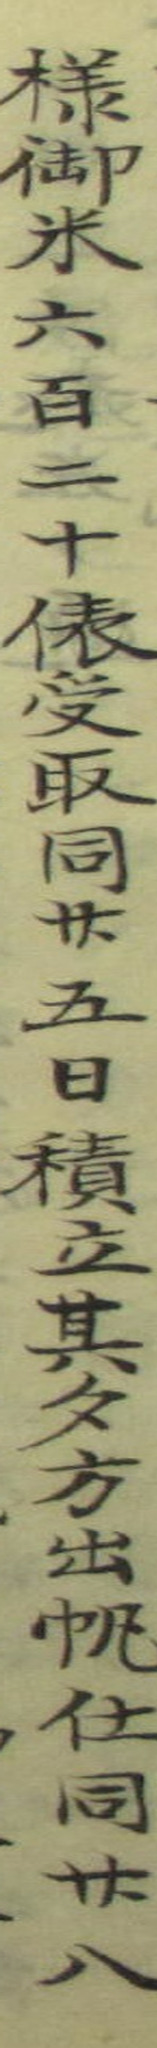様御米六百二十俵受取同廿五日積立其夕方出帆仕同廿八
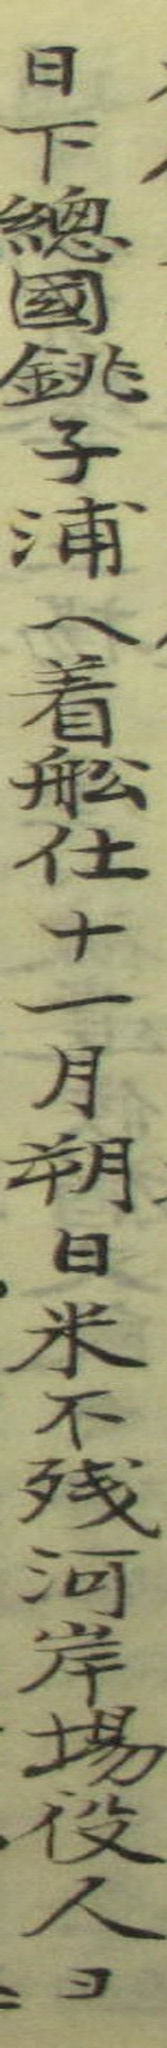日下総國銚子浦へ着舩仕十一月朔日米不残河岸場役人ヨ
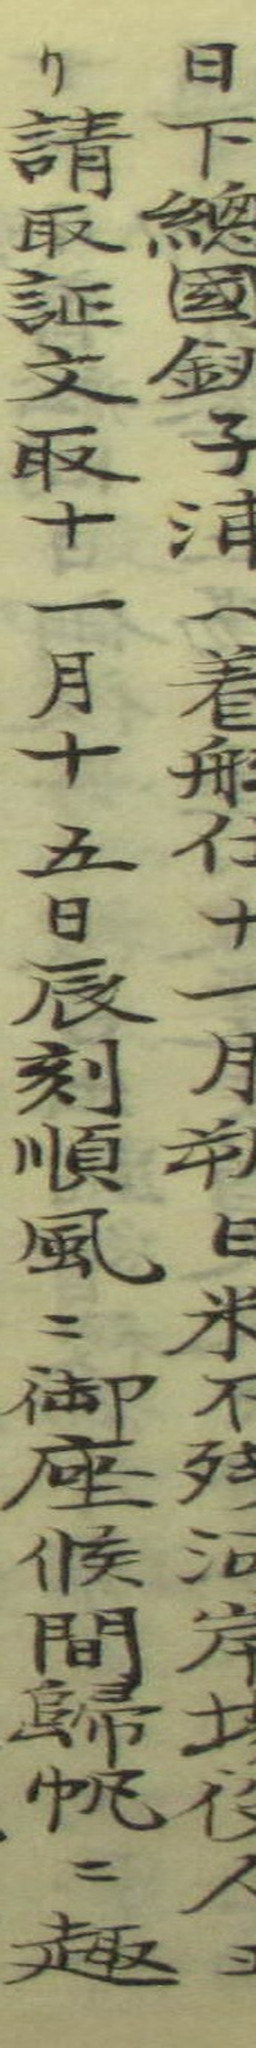リ請取証文取十一月十五日辰刻順風ニ御座候間帰帆ニ趣
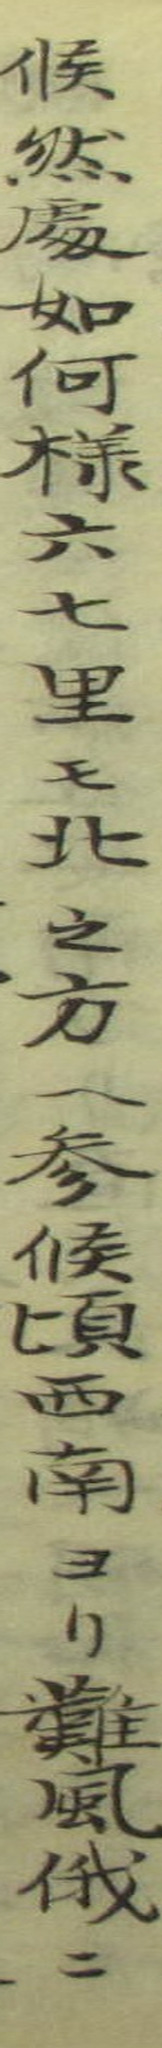候然處如何様六七里モ北之方へ参候頃西南ヨリ難風俄ニ
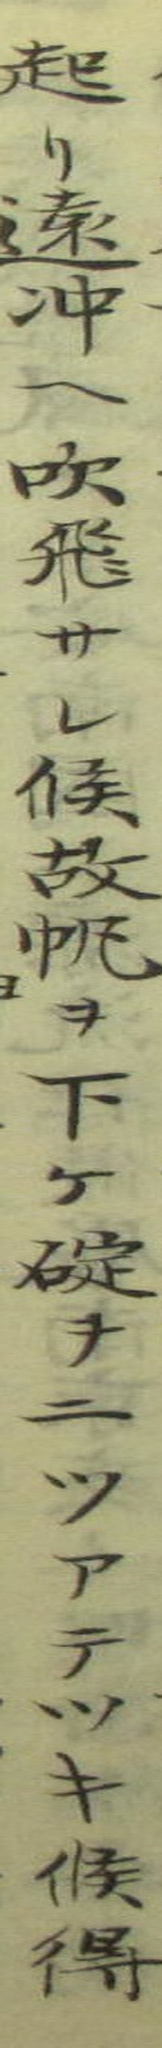起リ遠沖へ吹飛サレ候故帆ヲ下ケ碇ヲ二ツアテツキ候得
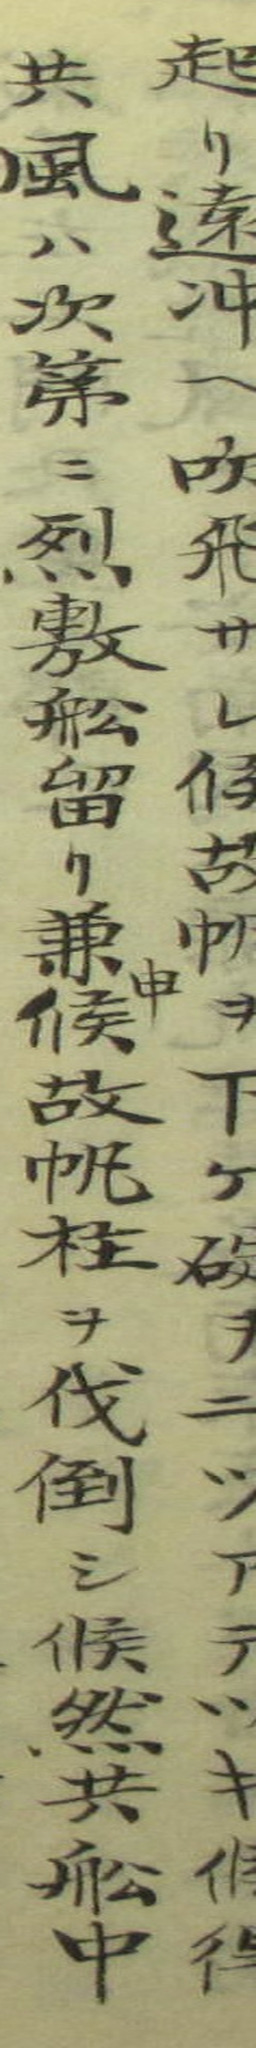共風ハ次第ニ烈敷舩留リ兼申候故帆柱ヲ伐倒シ候然共舩中
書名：異国船漂着記 外二
